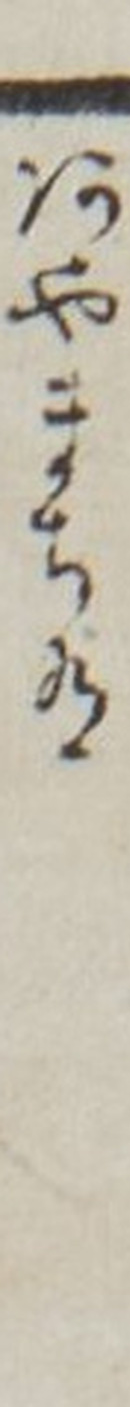あやまち有
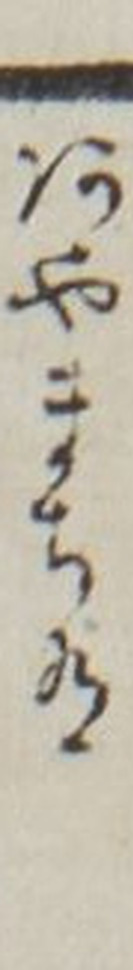あやまち有
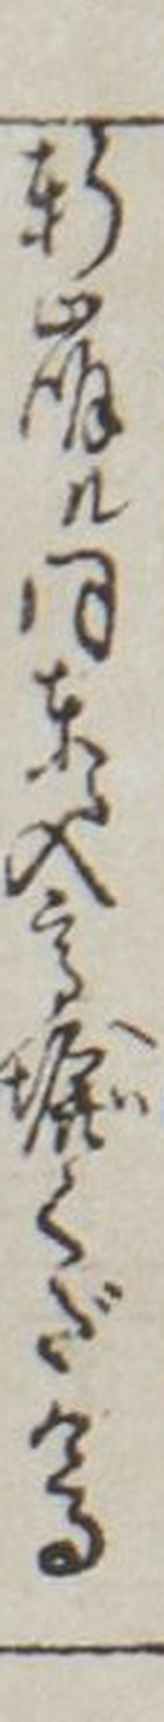軒崩る同東へ入高塀くだける
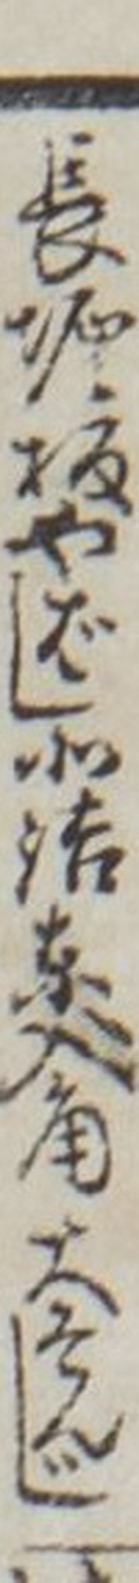長堀板やばし北詰東入角大そんじ
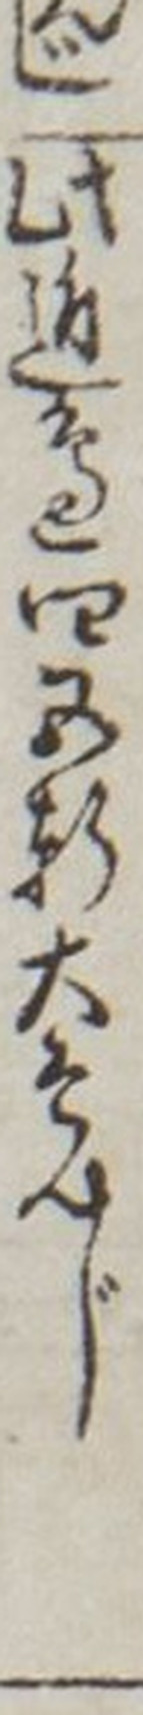此近辺四五軒大そんじ
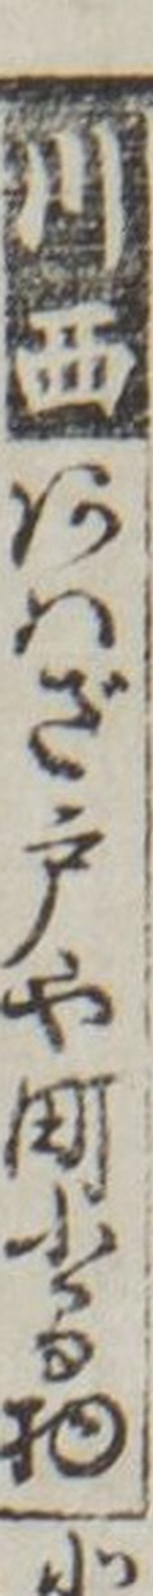川西あはざ戸や町小間物
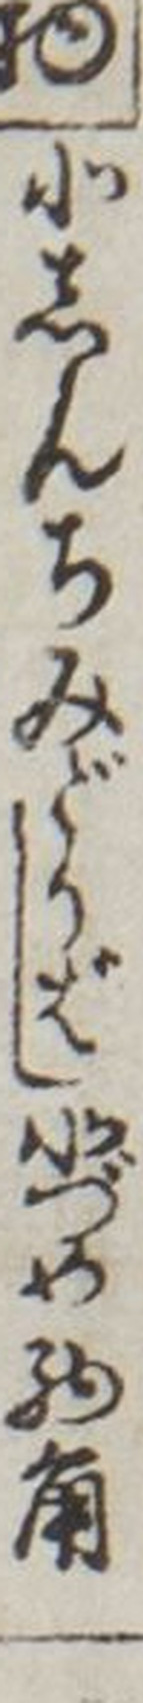北しんちみどりばし北づめ西角
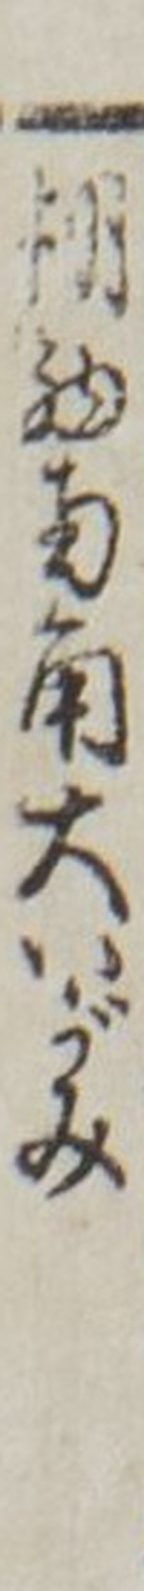棚西南角大いがみ
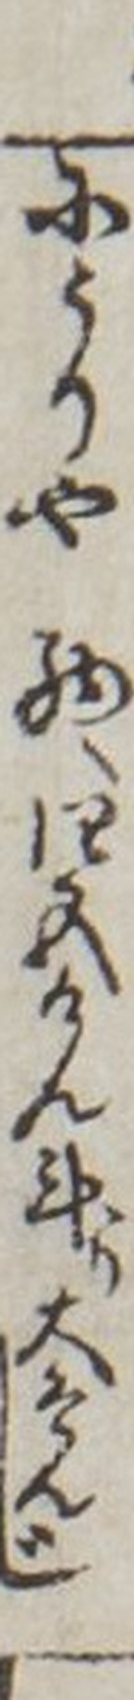にうりや西へ四五けん計り大そんじ
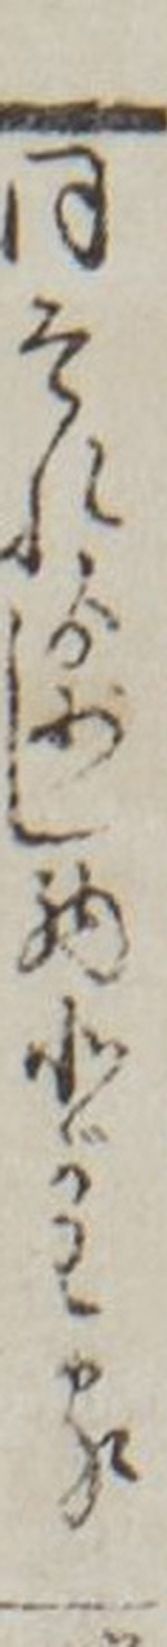同それより少し西北がわ家
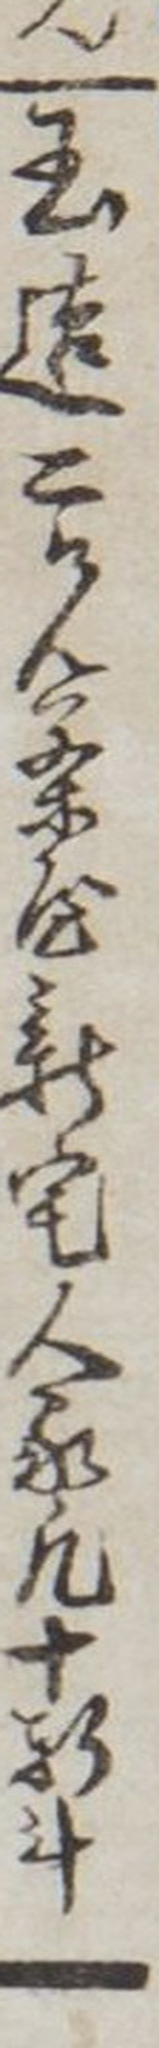玉造二けん茶屋新宅人家凡十軒計
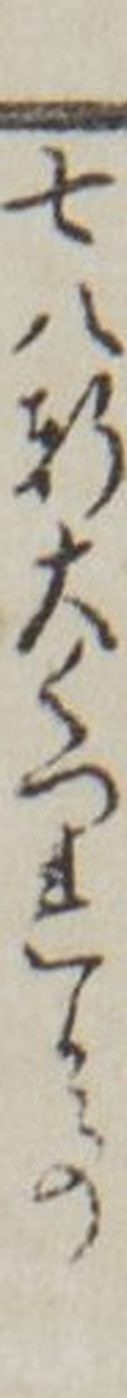七八軒大くつれ候事
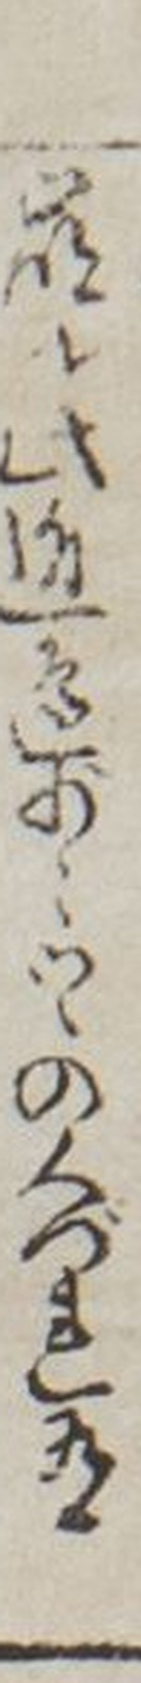崩る此近辺少々つゝのくづれ有
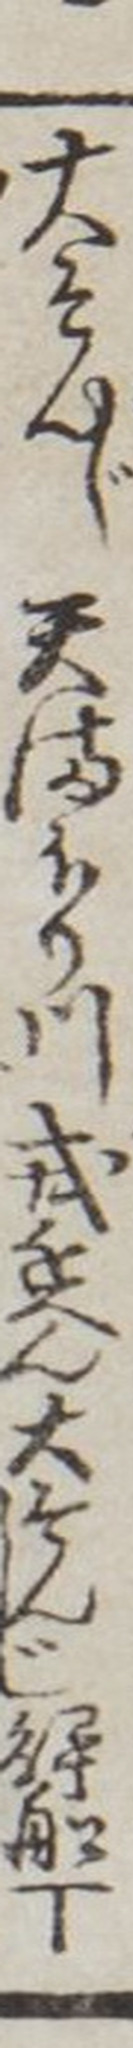大そんじ天満ほり川戎近へん大そんじ解船町
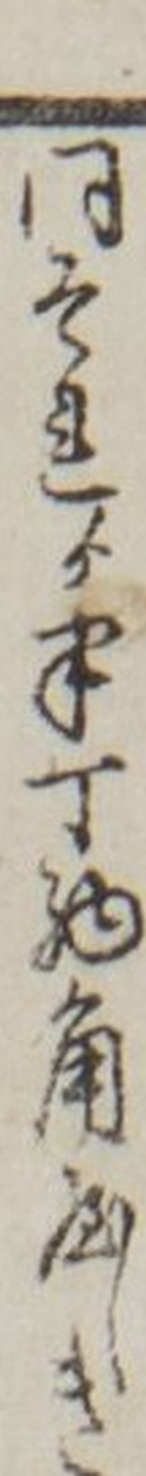同それより半丁西角やしき
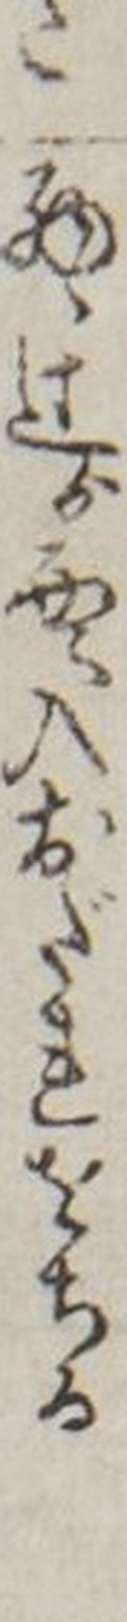西へ辻より西へ入おだれをちる
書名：本しらべ大阪大地震の次第初編
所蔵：あいおいニッセイ同和損保株式会社
